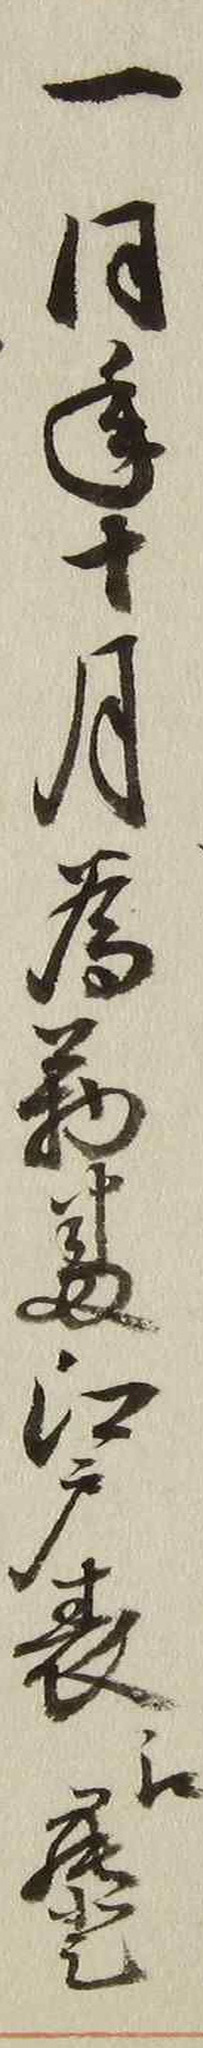一同年十月為勤番江戸表江罷登
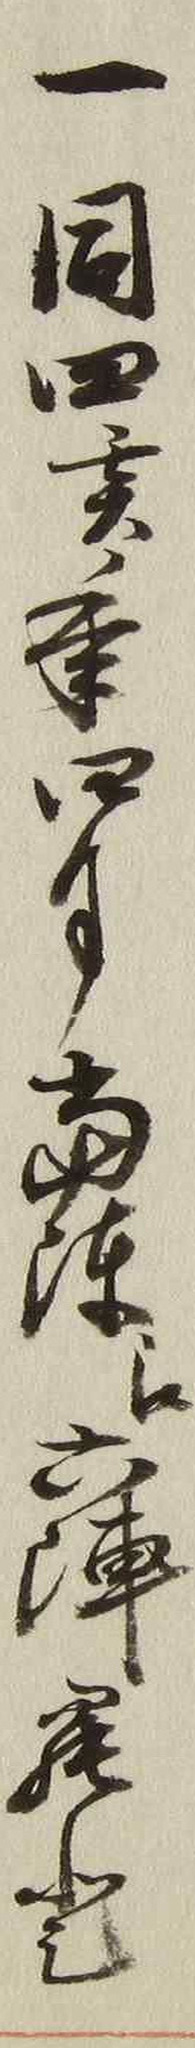一同四亥年四月当陣江六陣罷登
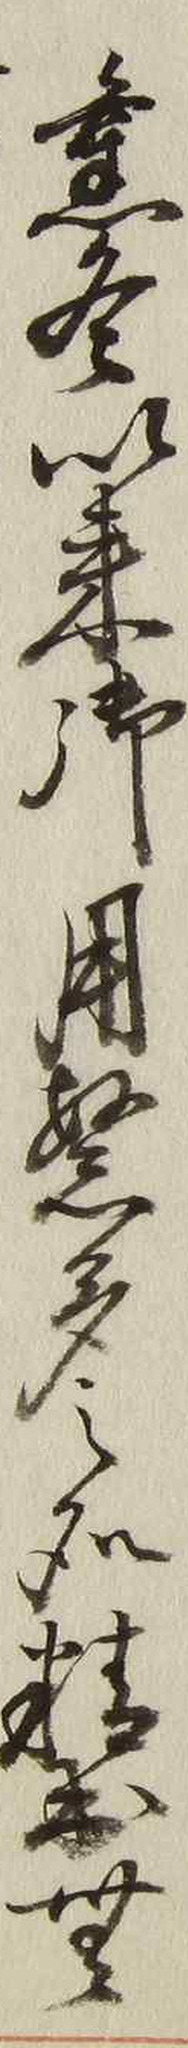旧冬以来御用繁多之処精出無
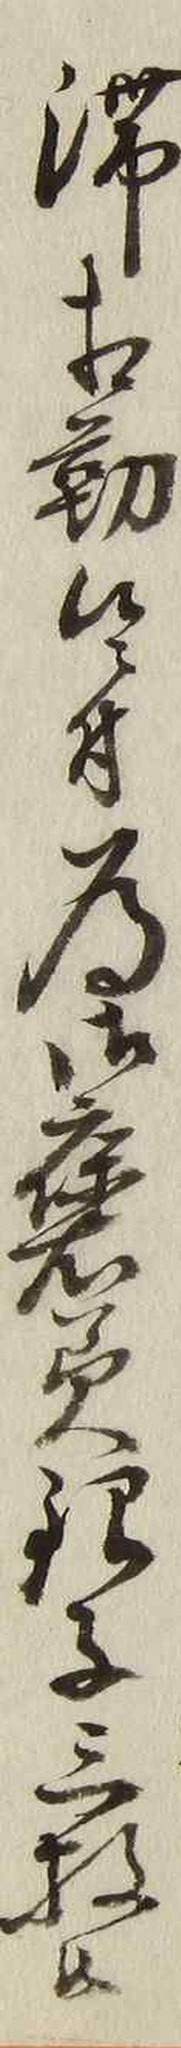滞相勤候ニ付為御褒美銀子三枚被
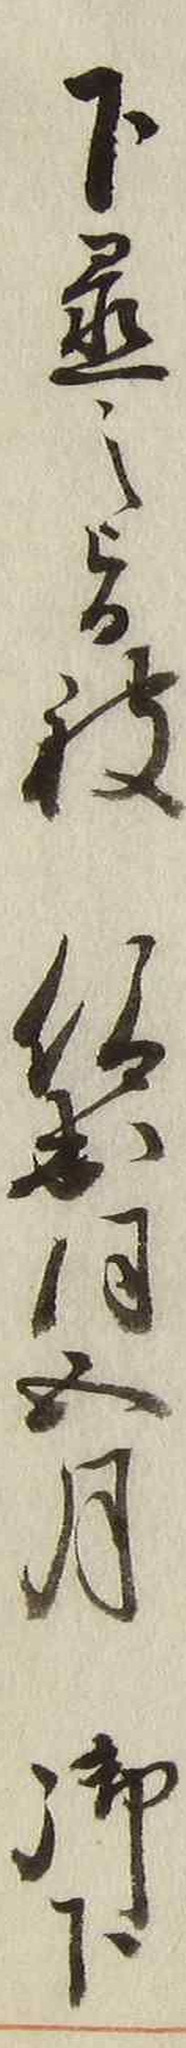下置之旨被仰出同五月御下
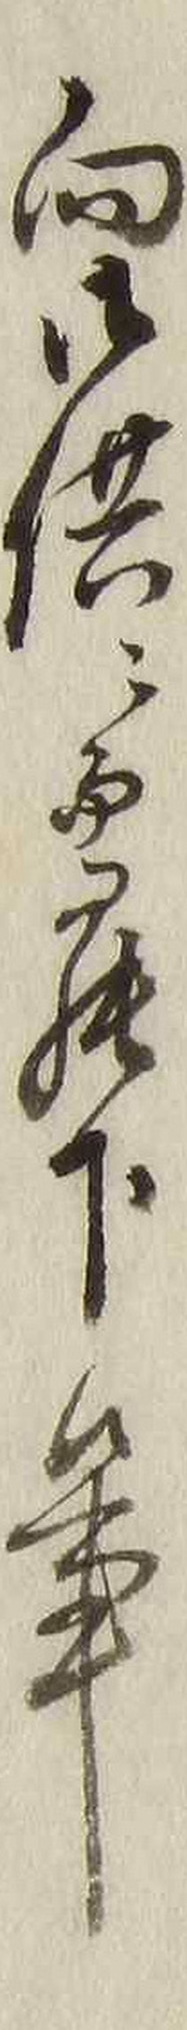向御供ニ而罷下候事
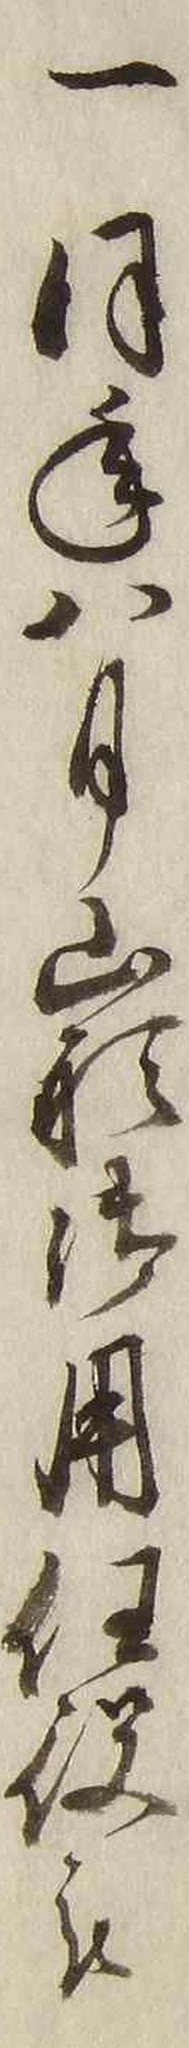一同年八月山形御用任役被

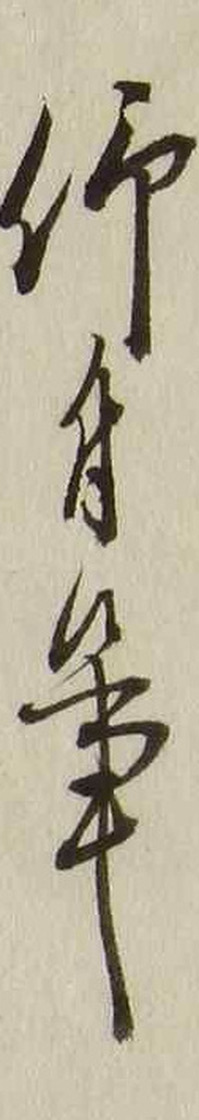仰付候事
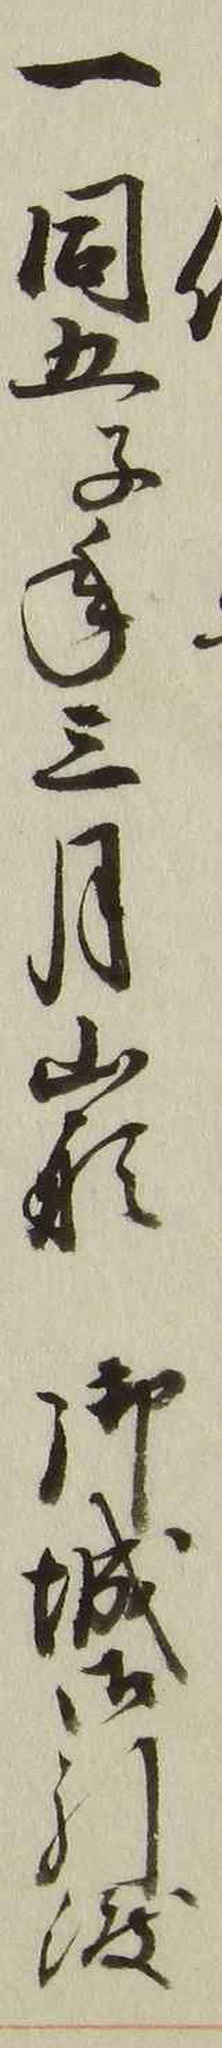一同五子年三月山形御城御引渡
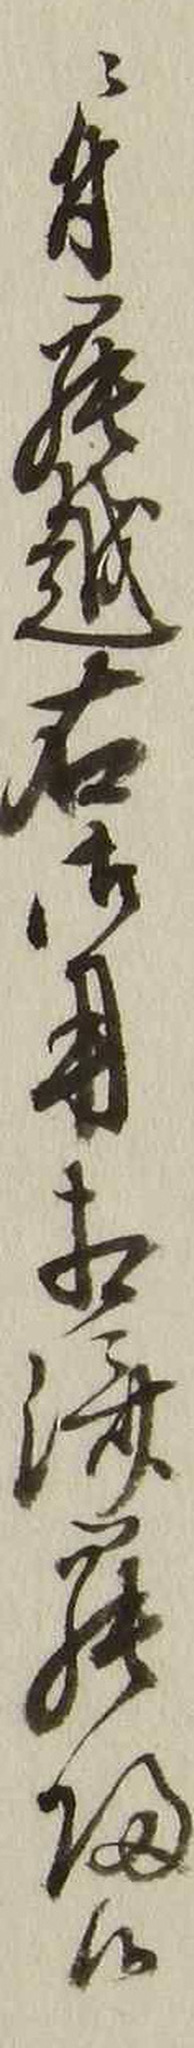ニ付罷越右御用相済罷帰候
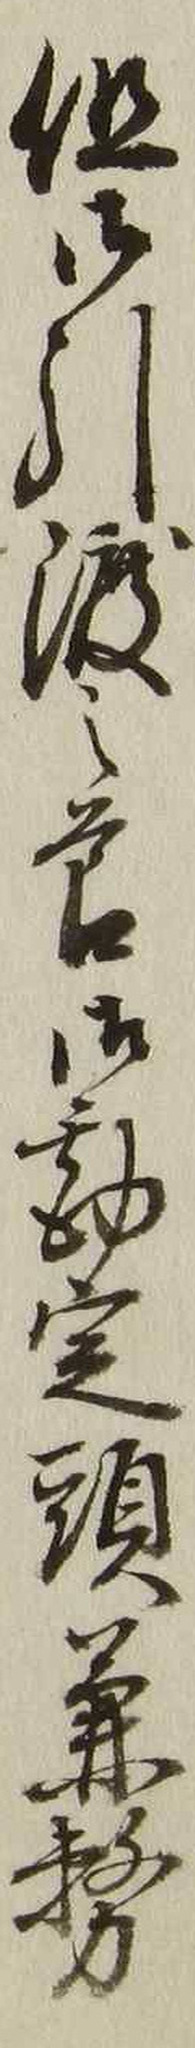但御引渡之節御勘定頭兼務
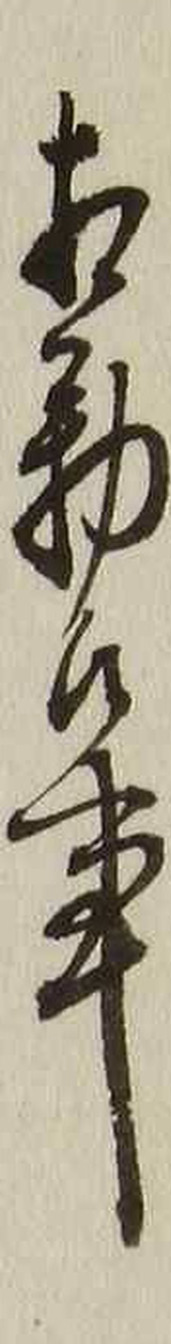相勤候事
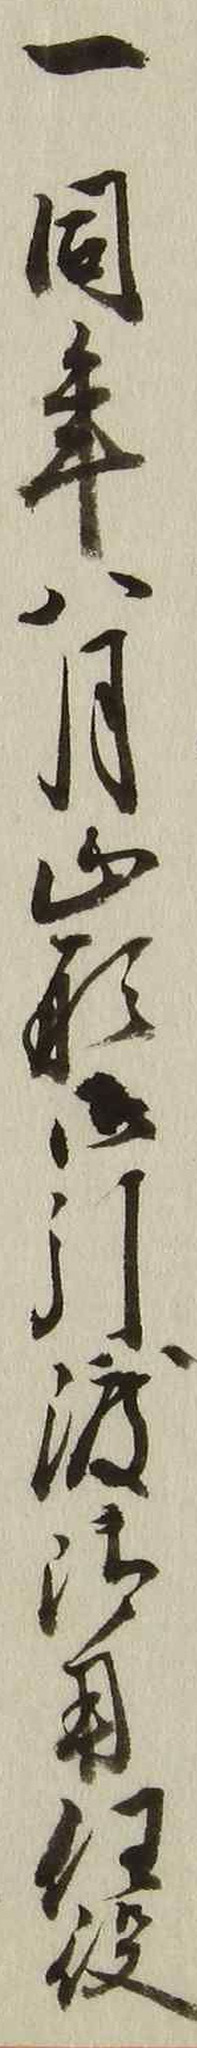一同年八月山形御引渡御用任役
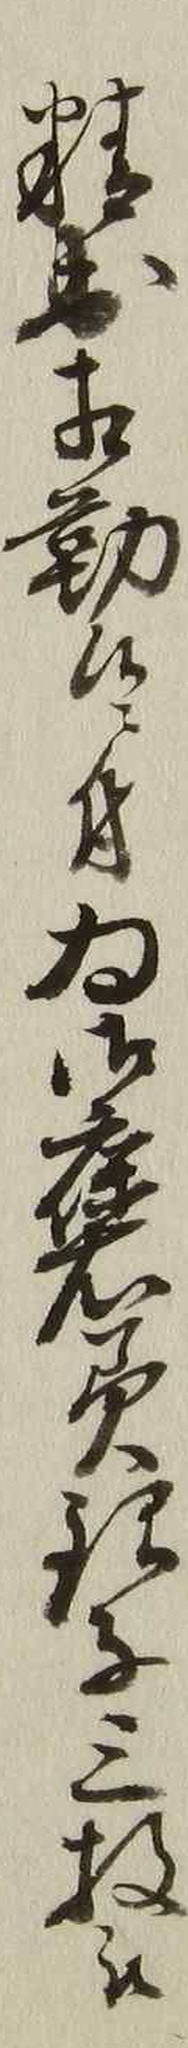精出相勤候ニ付為御褒美銀子三枚被
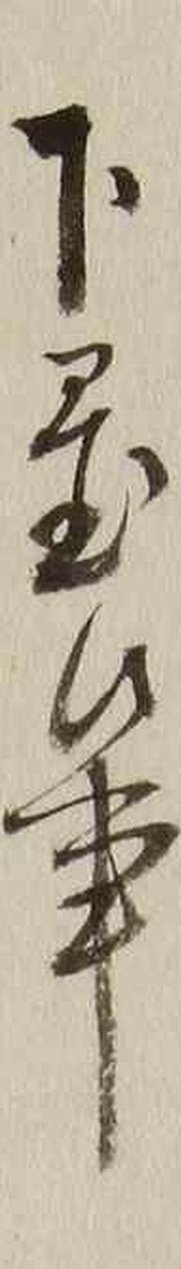下置候事
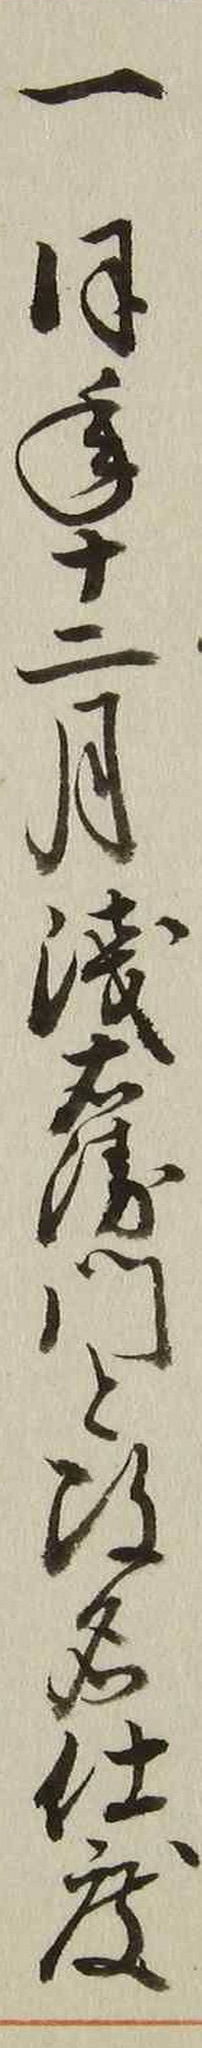一同年十二月浅右衛門と改名仕度
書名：諸士系譜　巻之27　い之部27
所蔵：会津若松市立会津図書館
